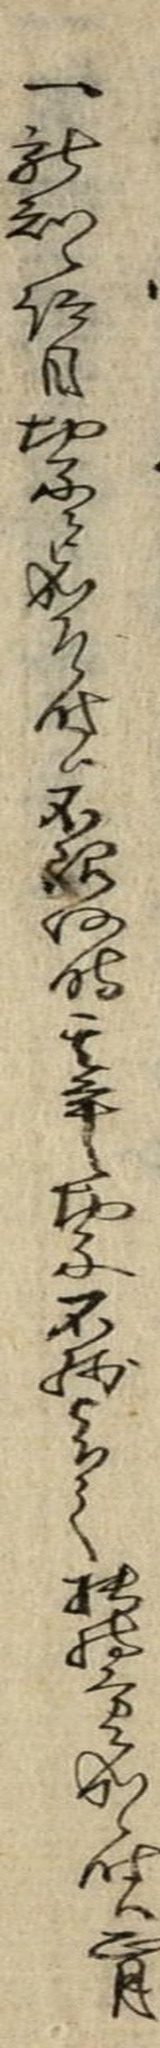一新知之跡目切米に被成下候時は不限何時其年之切米不残被下之扶持方に成候時は正月
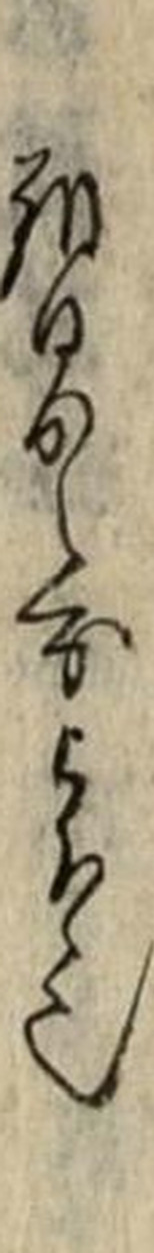朔日ゟ之分被下候也
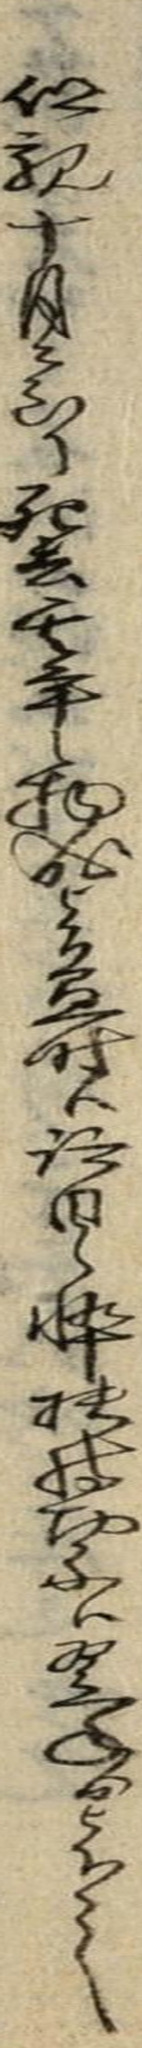但親十月に至り死去其年之物成被下置時は跡目之忰扶持切米は翌年ゟ被下之
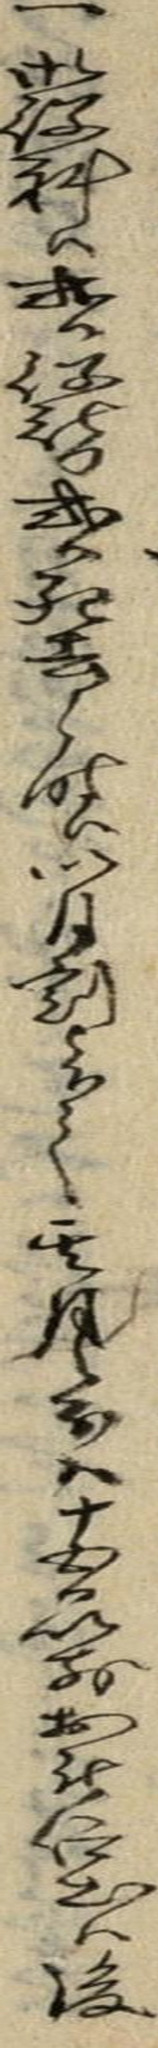一御役料は或は役替或は死去之時は以月割被下之其月之分は十五日以前於被仰出は後
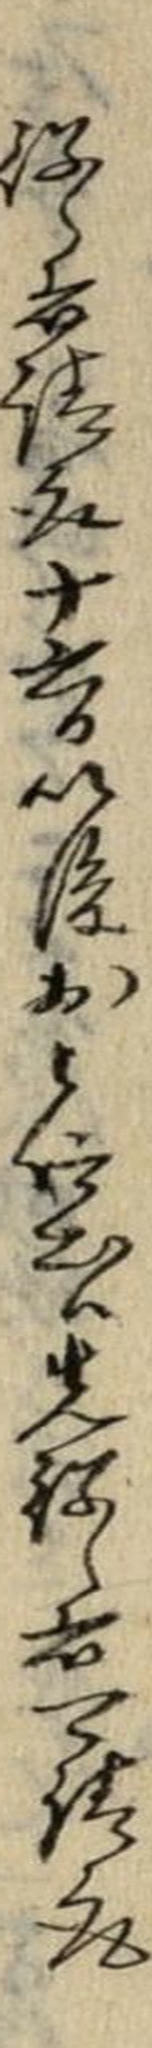役之者請取十六日以後於被仰出は先役之者可請取
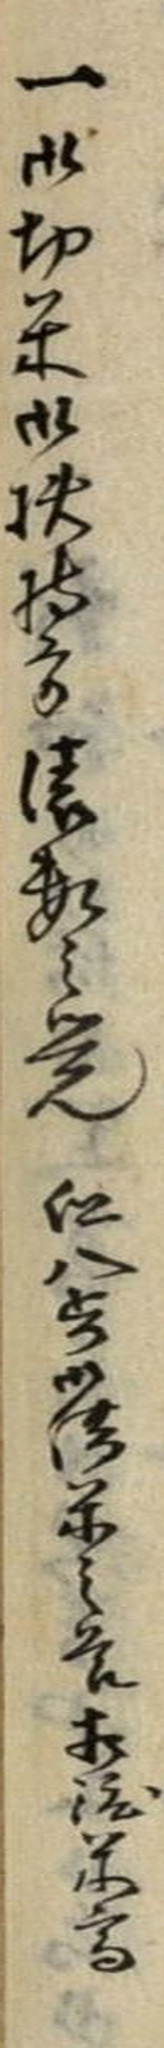一御切米御扶持方俵数之覚但八歩御借米之節相渡米高

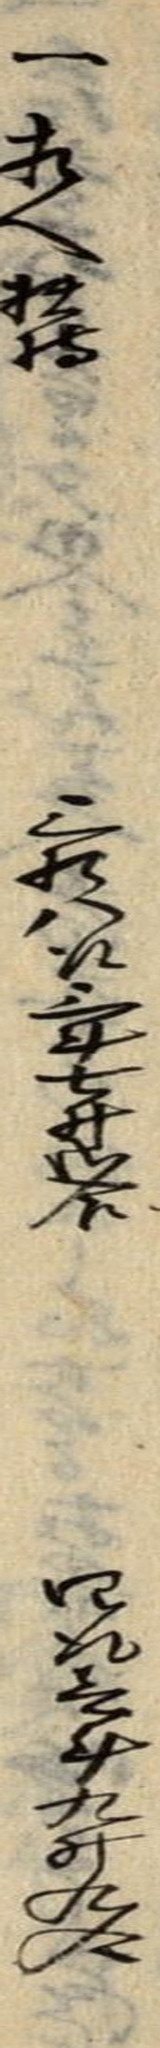一拾人扶持三拾八俵三斗七升弐合四俵壱斗九升九合
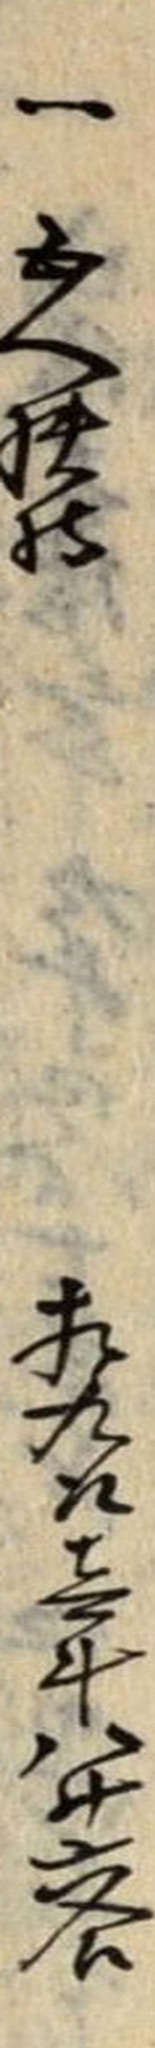一五人扶持拾九俵壱斗八升六合
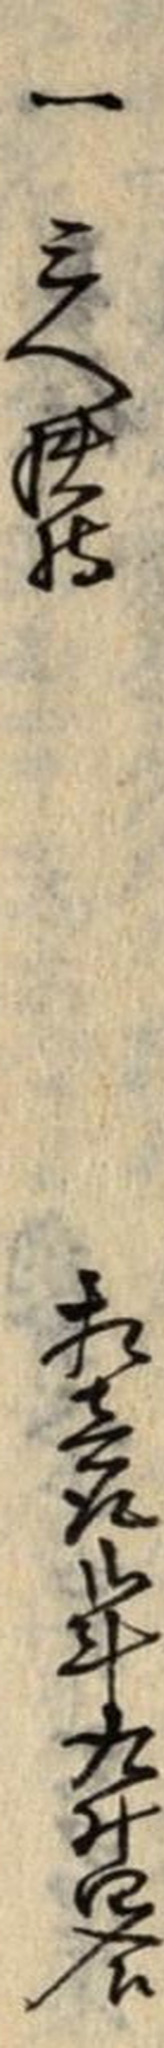一三人扶持拾壱俵弐斗九升四合
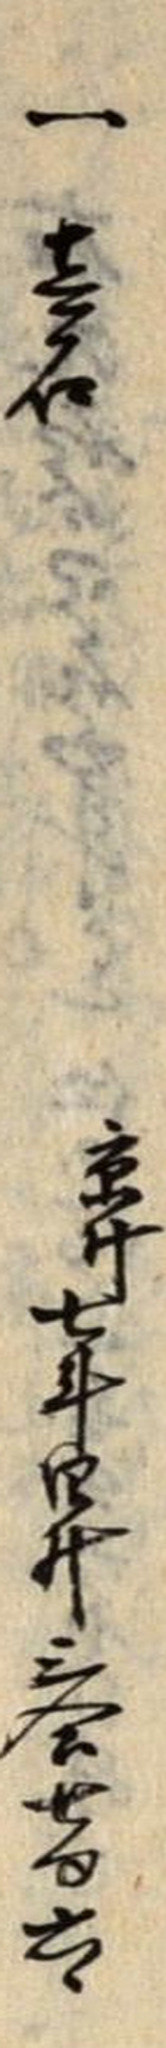一壱石京升七斗四升三合七勺六才
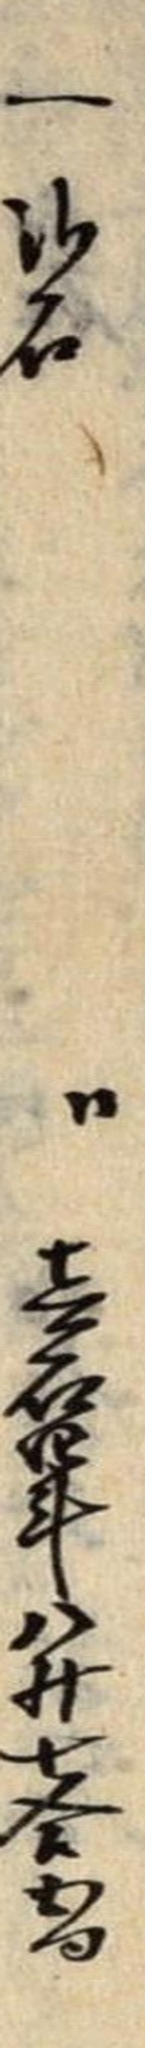一弐石同壱石四斗八升七合五勺
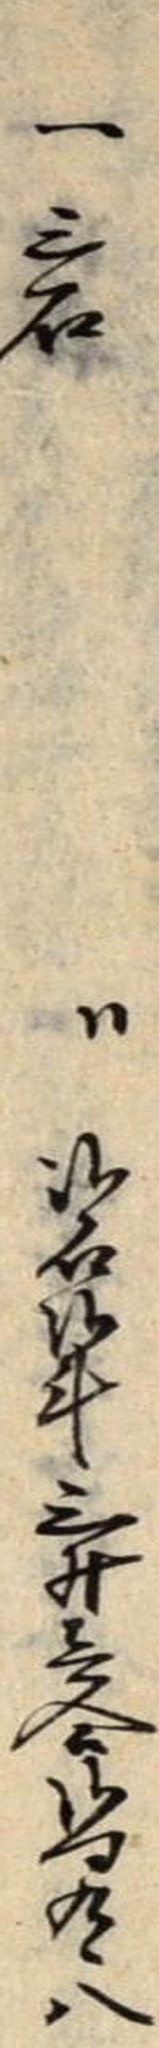一三石同弐石弐斗三升壱合弐勺九才八
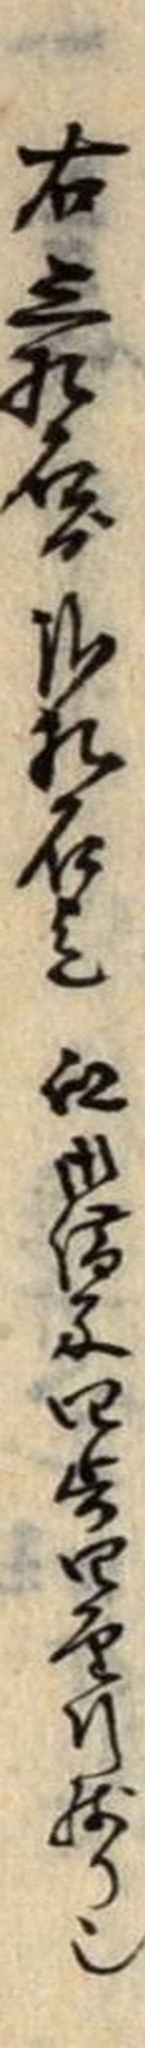右三拾石ゟ弐拾石迄但御借米四歩四厘引残り也
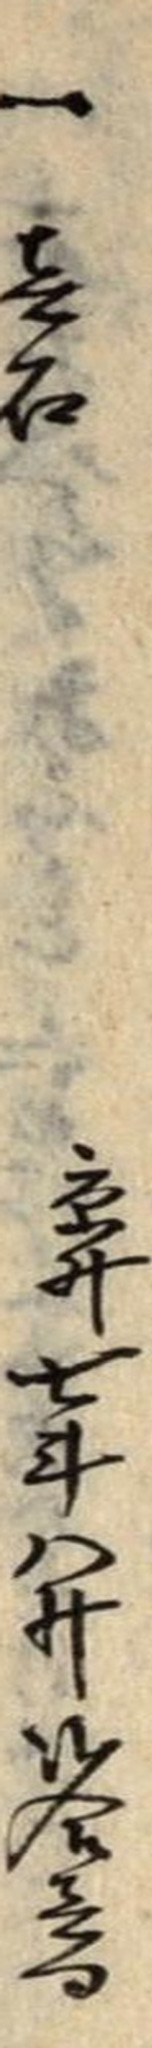一壱石京升七斗八升弐合壱勺
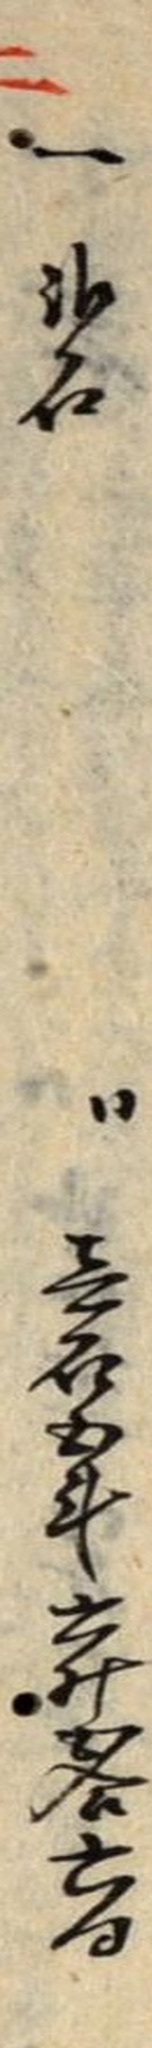一弐石同壱石五斗六升五合六勺

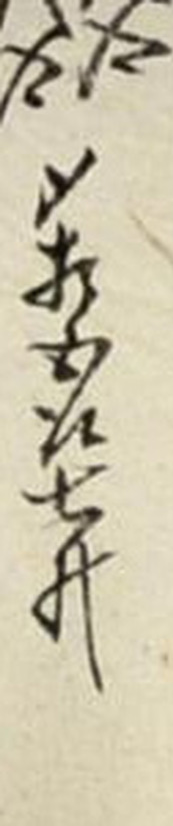〆拾五俵七升
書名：御用并被仰出之部
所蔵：福井県文書館 Fukui Prefectural Archives
